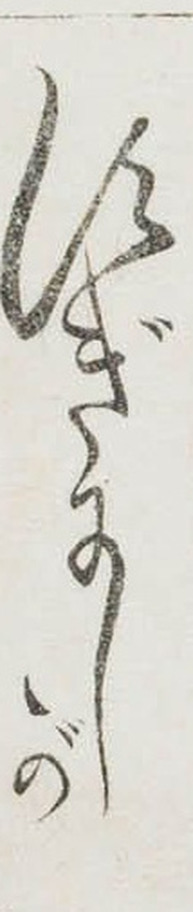すぎにしが
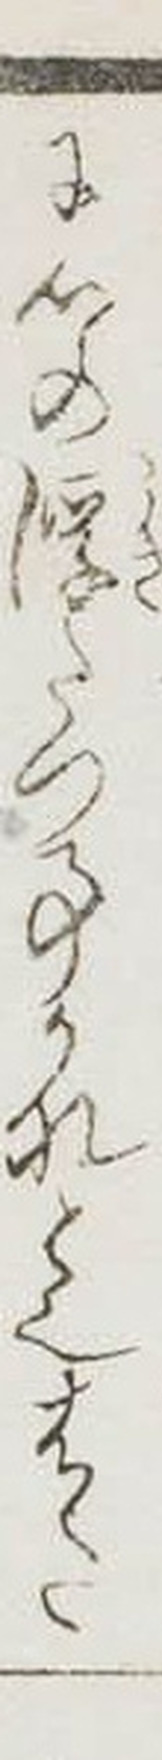に心の浮たつ事かなと也はた
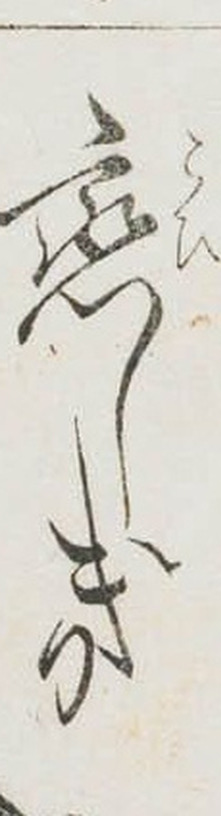恋しき
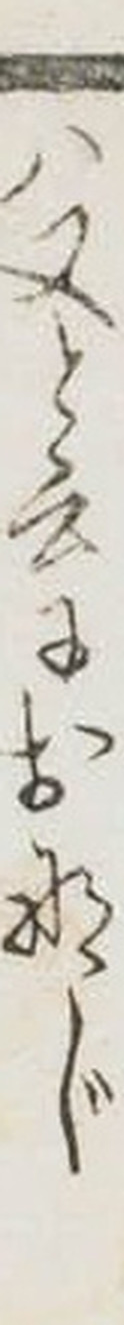は又と云におなじ
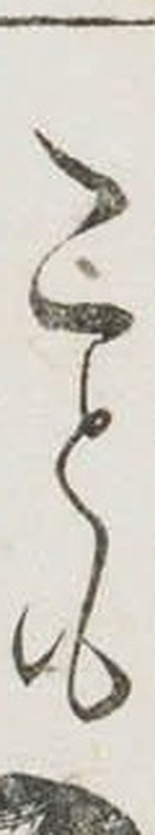ことも
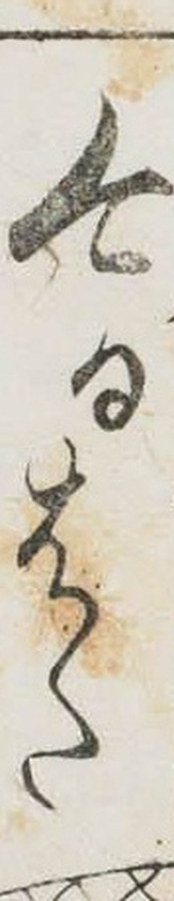今日はた
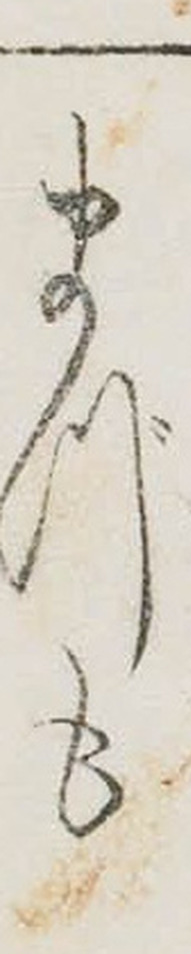まつも
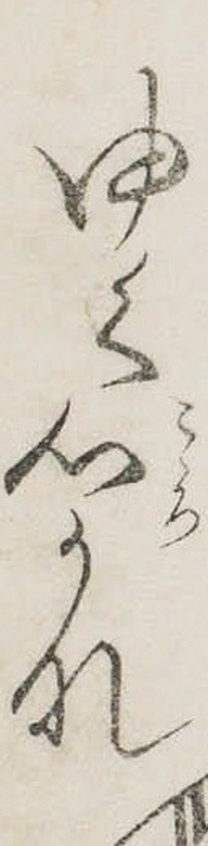ゆく心かな

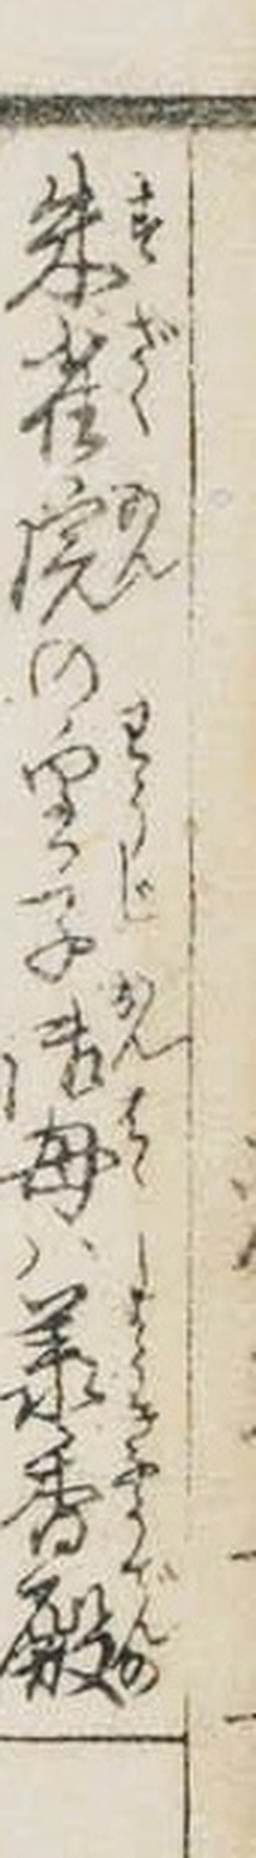朱雀院の皇子御母は承香殿
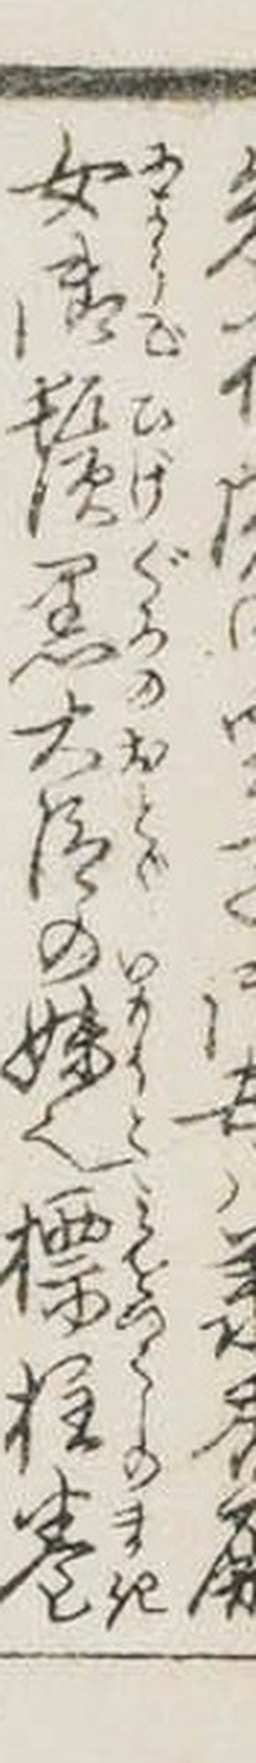女御鬚黒大臣の妹也標柱巻
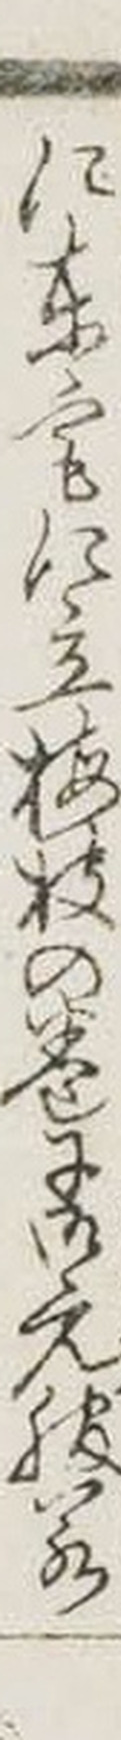に東宮に立梅枝の巻に御元服若
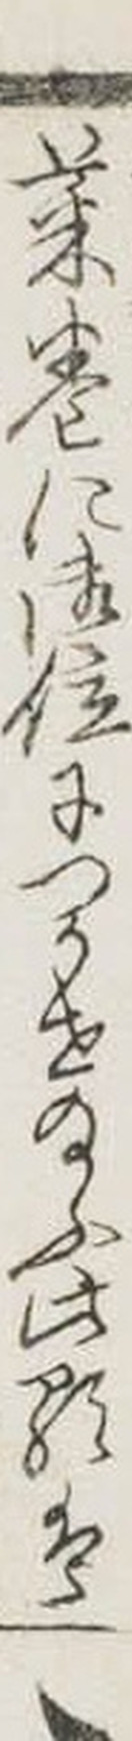菜巻に御位につかせ給ふ此歌は
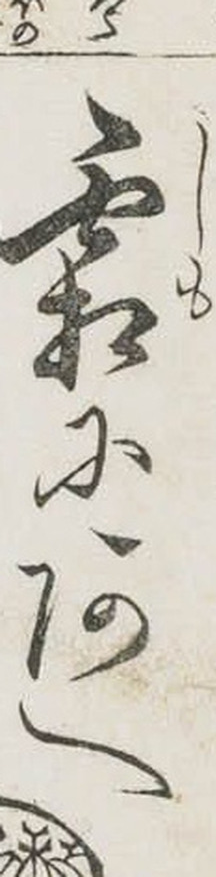霜にあへ
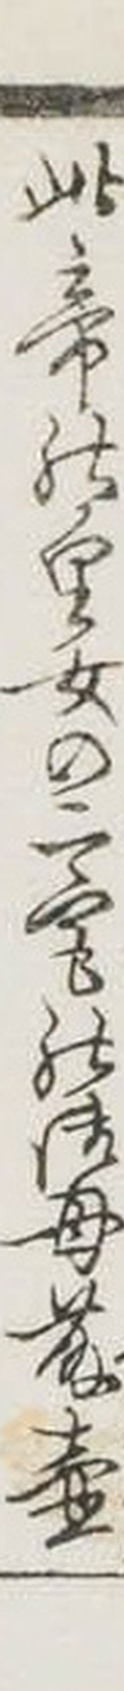此帝の皇女の二宮の御母藤壺
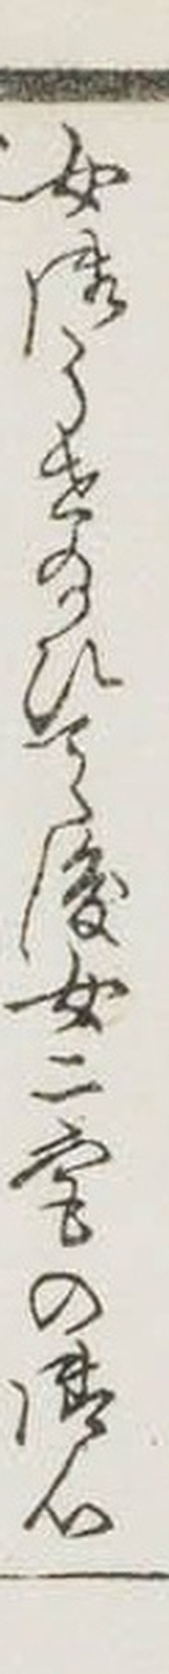女御うせ給ひて後女二宮の御心
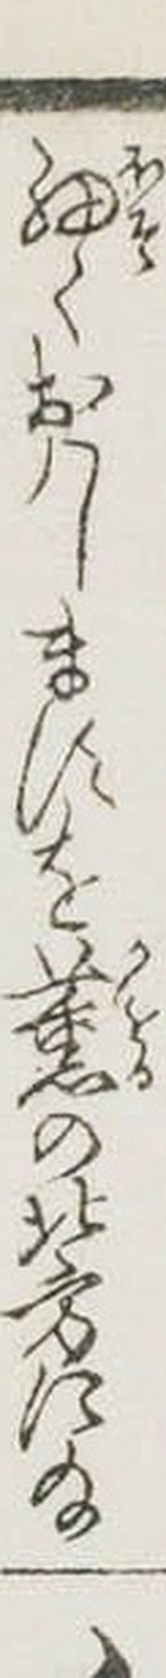細くおはしますを薫の北方に給
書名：源氏百人一首
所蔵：東京学芸大学教育コンテンツアーカイブ
